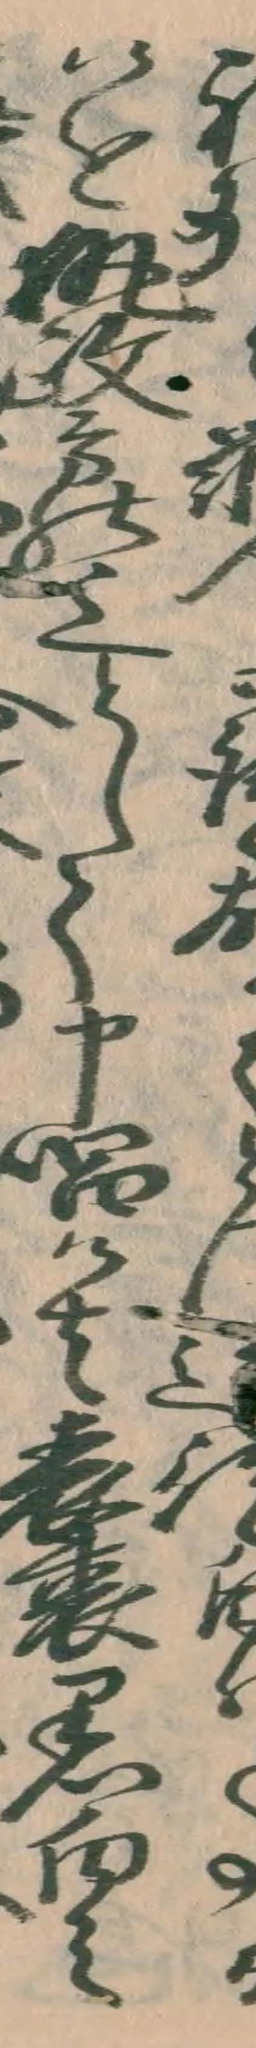候を執政方の上として申唱候者表裏黒白之
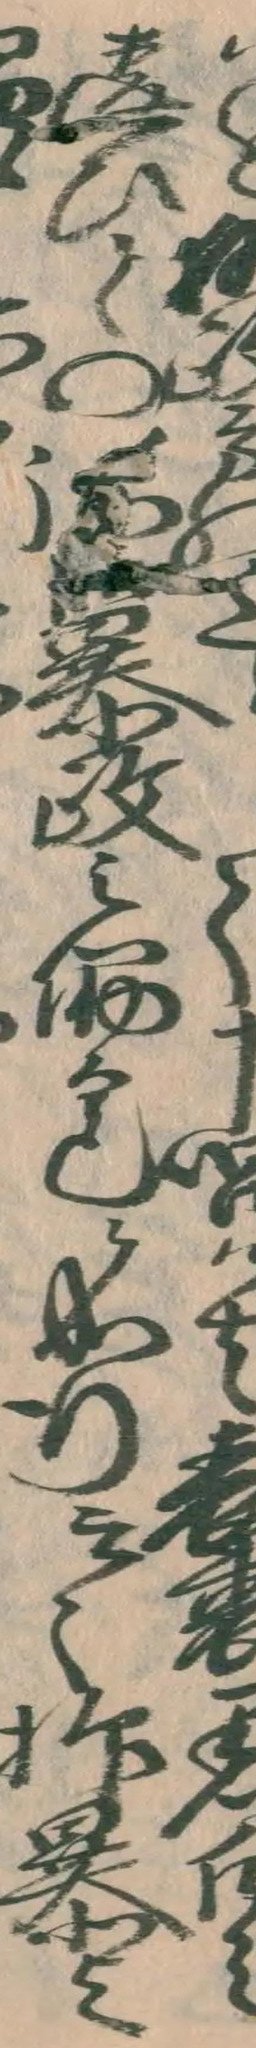違ひニ候○弥御暴政之筋而已ニ成行云々抑暴と
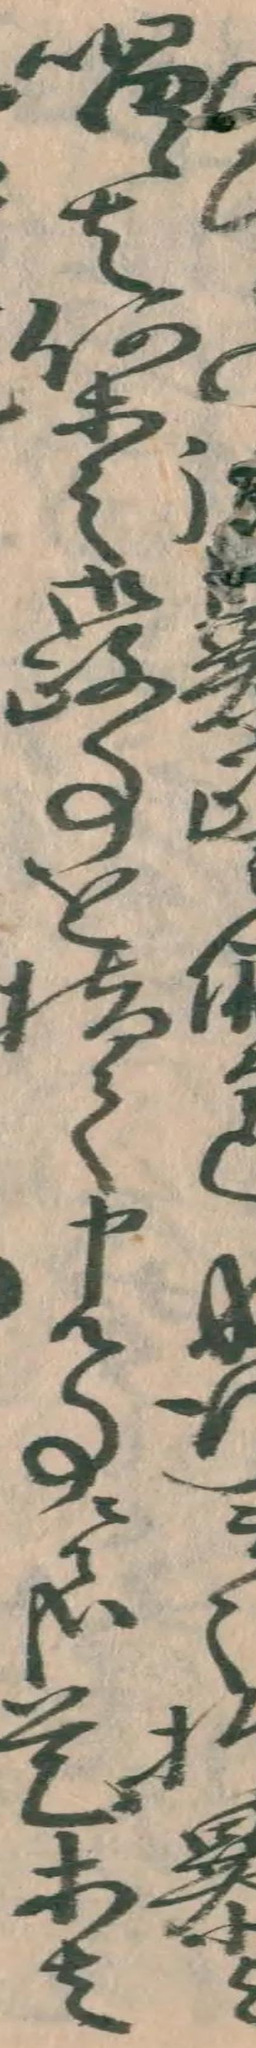唱候者何等之御政事を指て申候事ニ候哉是等者
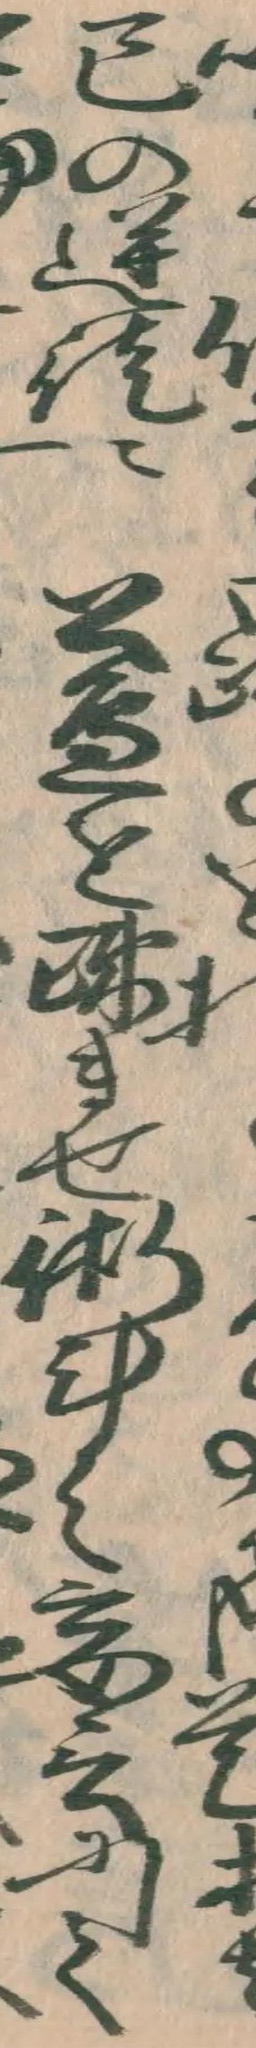己の逆徒ニ公邊を疎ませ術斗之妄言にして
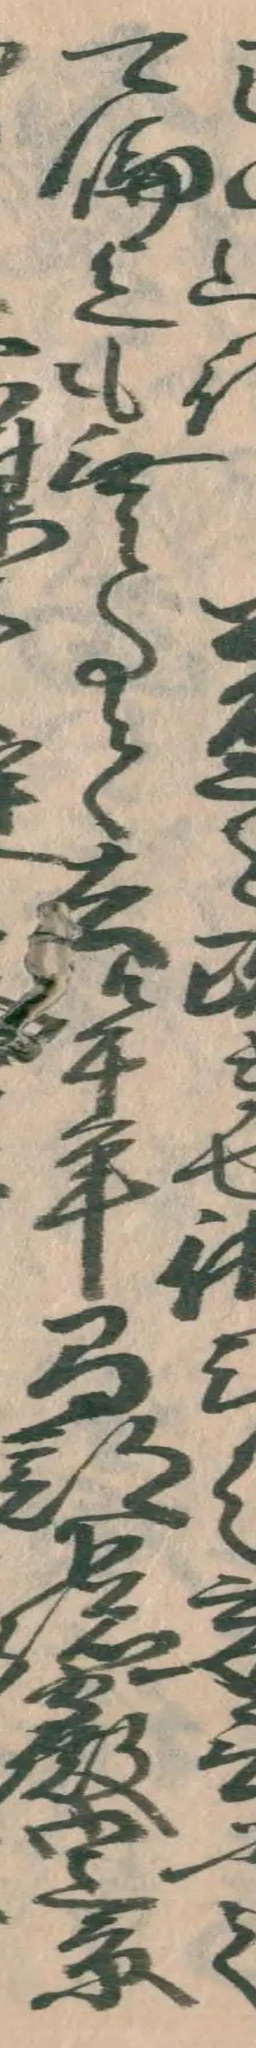可論迄も無之事ニ候去ル午年間部下総守殿御上京
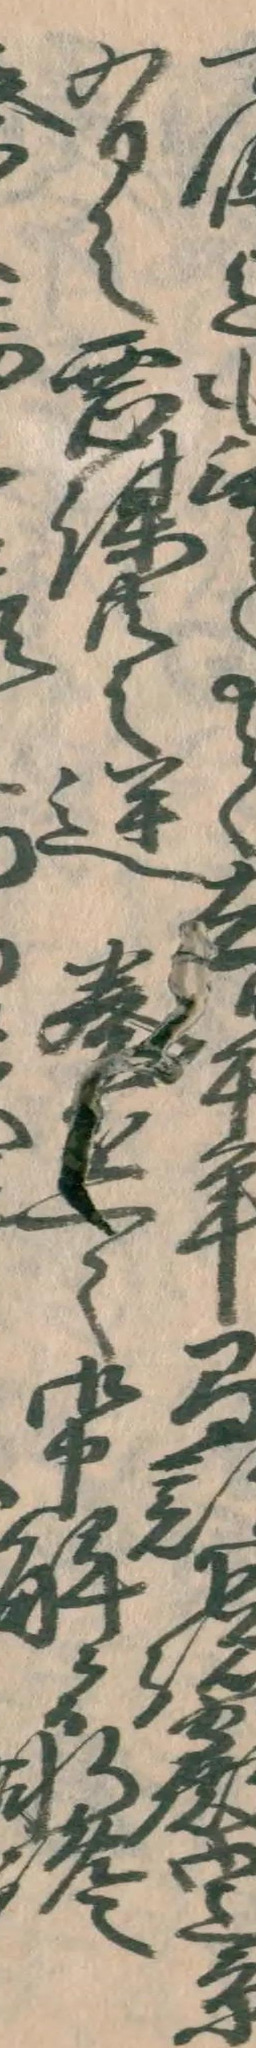有之悪謀共之逆奏を一々御申解候而漸讒
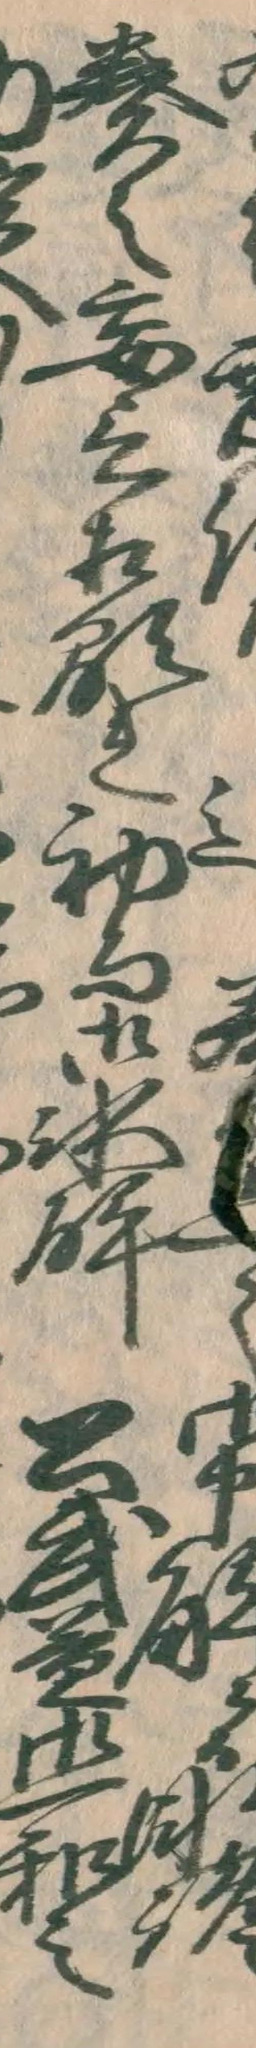奏之妄言相顕れ初而御氷解公武益御一和之
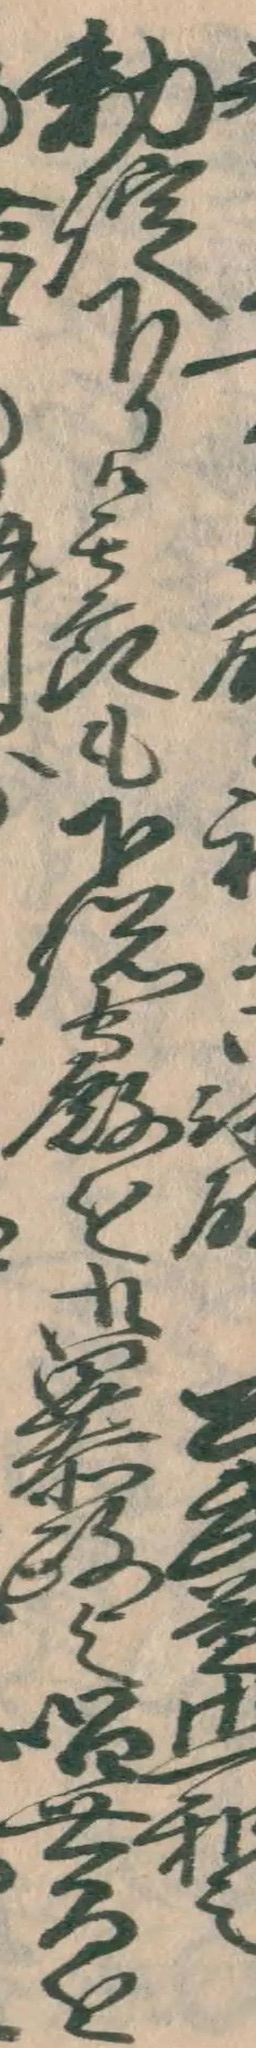勅諚下り候其節も下総守殿を御暴政と唱世間を
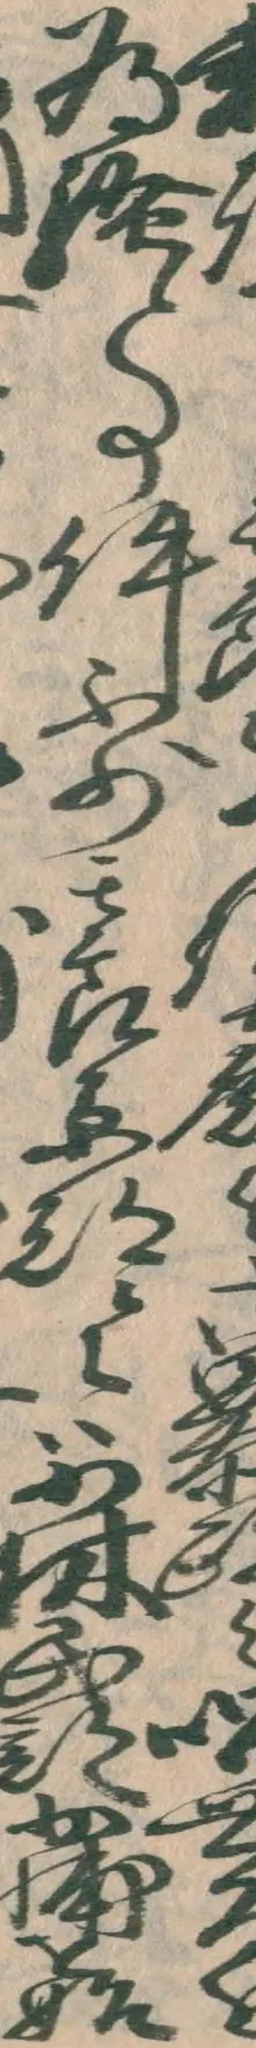為騒候事件不少其節京都ニてハ小林民部少輔を始
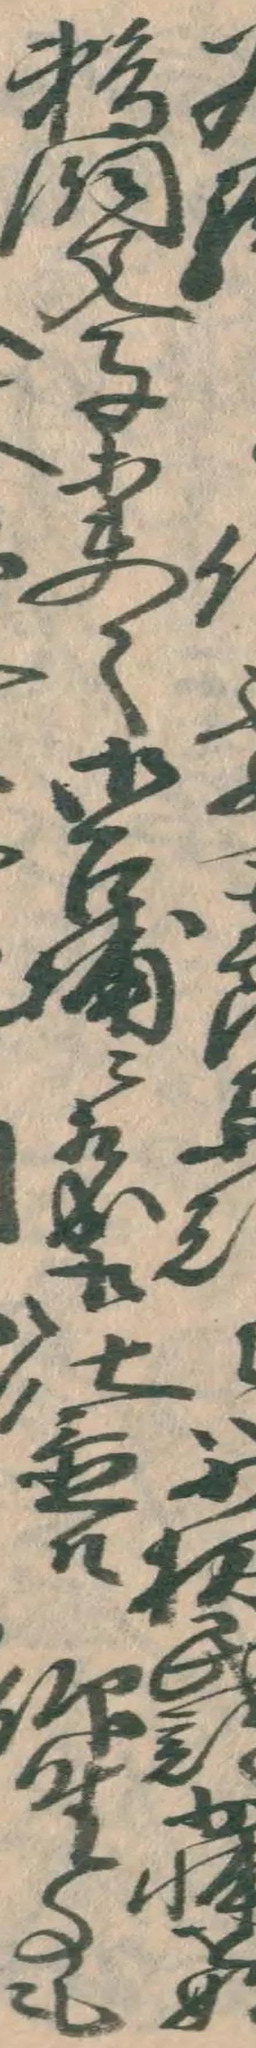鵜飼父子等夫々御召捕ニ相成御仕置被仰付候事も
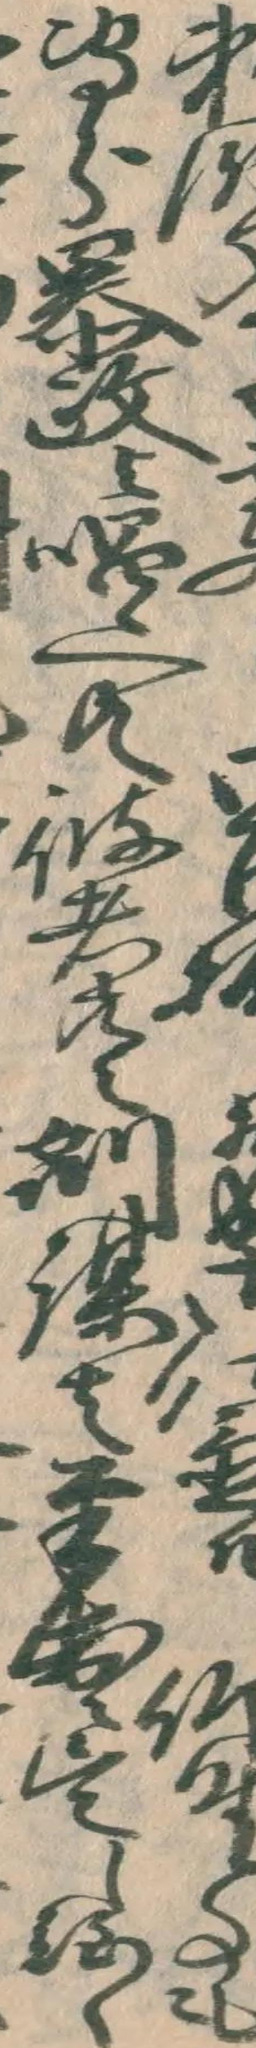専ら暴政と唱候へ共彼者共之姧謀者筆帋ニ尽し難く
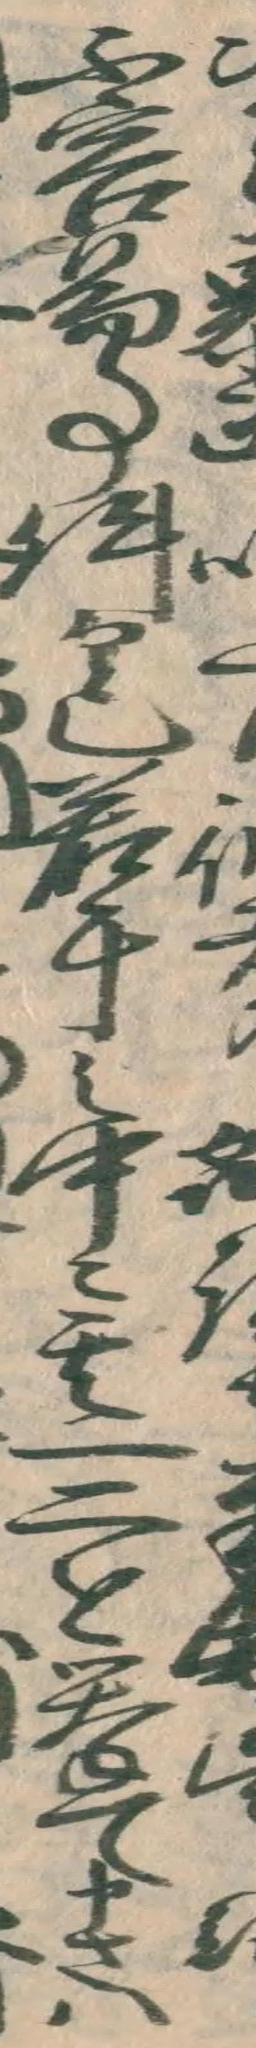不容易事件而已若干之中ニ其一ニを挙て申さハ
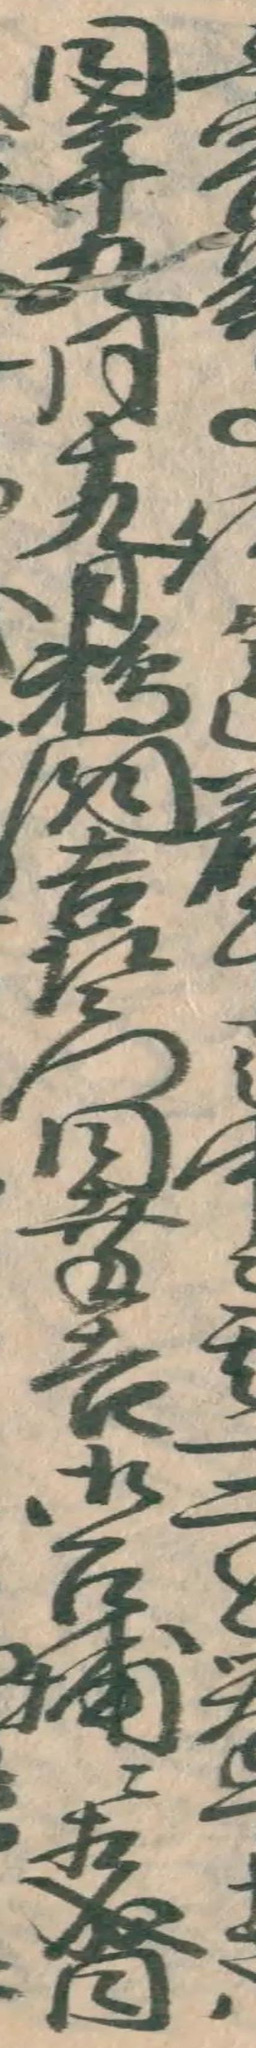同年九月十九日鵜飼吉左衛門同幸吉御召捕ニ相成同
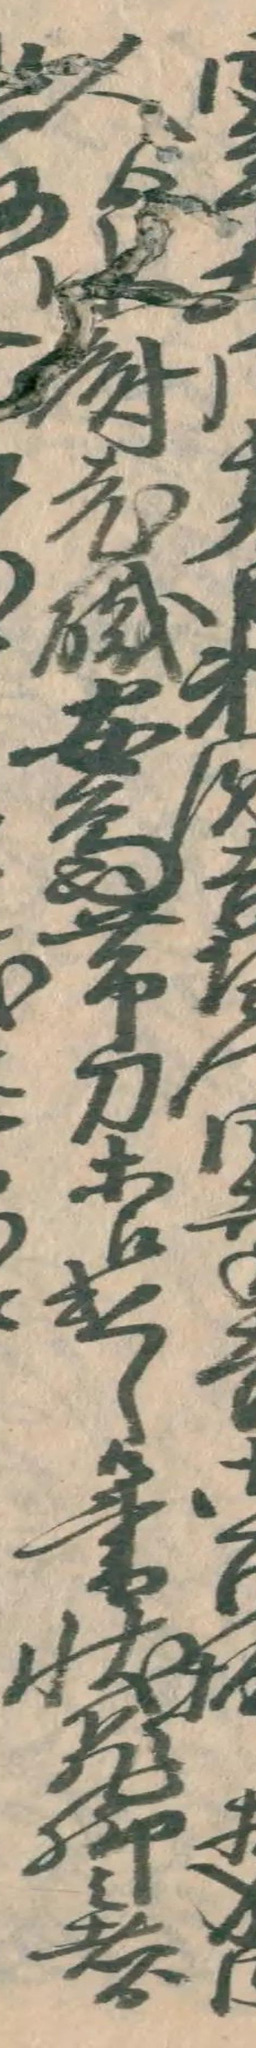人ゟ水府老職安嶋帯刀等江遣し候書状飛脚之者ゟ
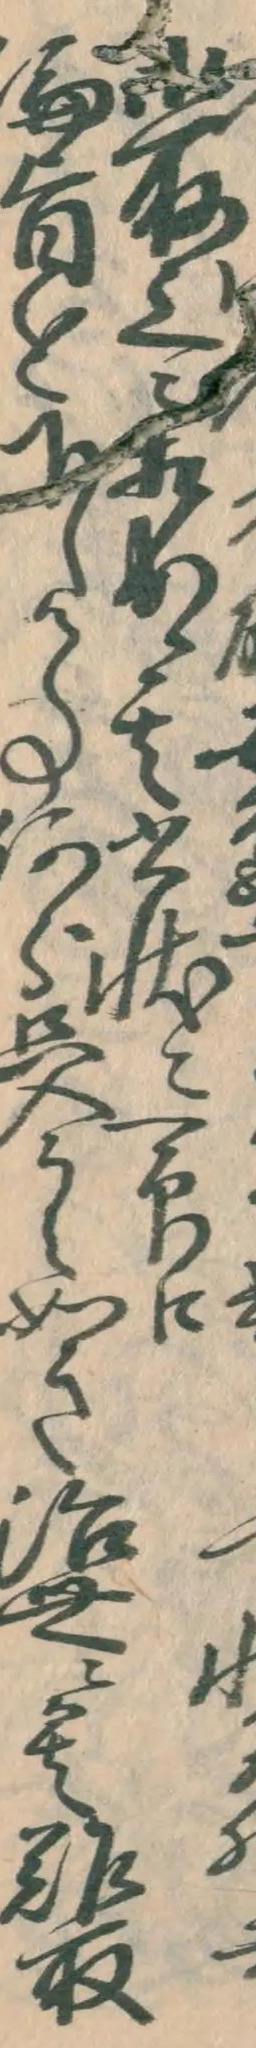綸旨を下し候事何分只今之如き治世ニ而者難取
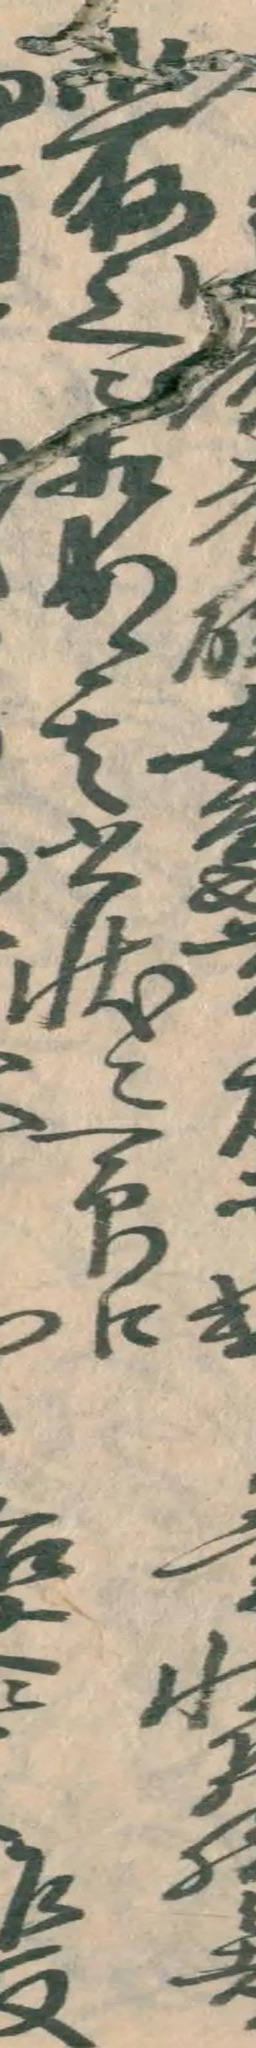御取上ニ相成候其書状二天下江
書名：麗斎叢書. 20
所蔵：国立国会図書館 National Diet Library, JAPAN
